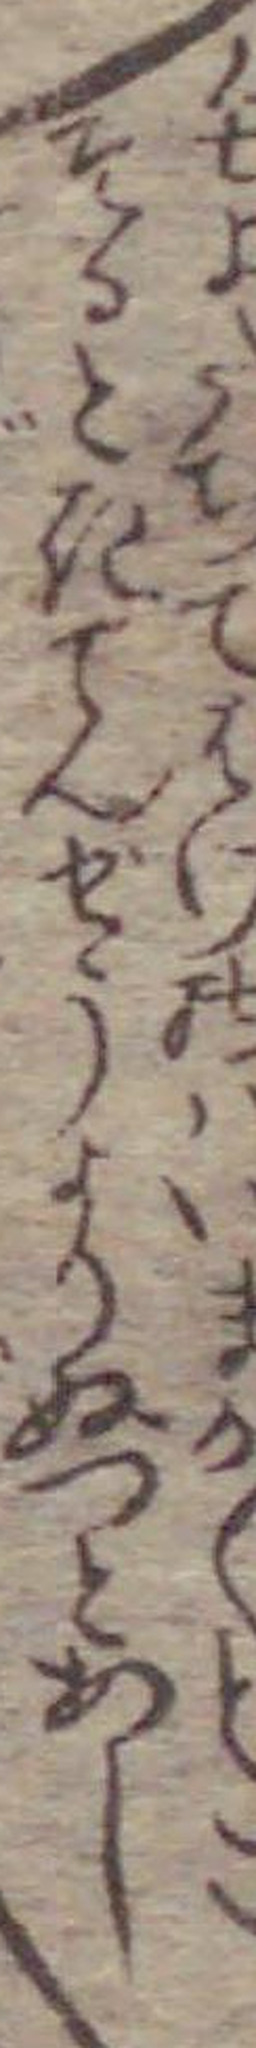そるときてんぜうよりぬつとあし
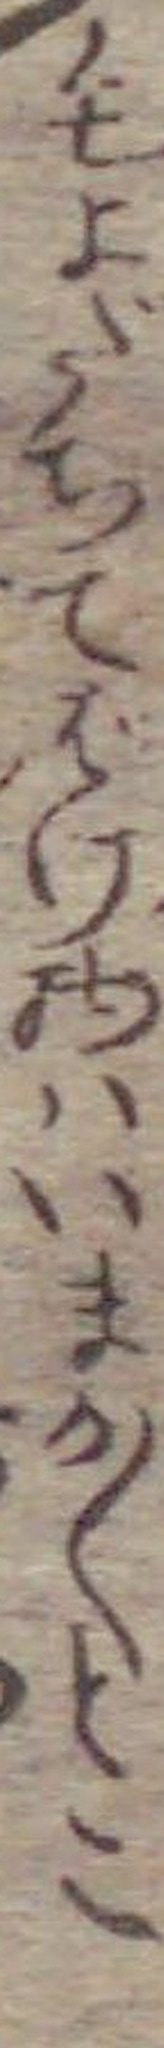毛よだちてばけ物はいまか〳〵とこ
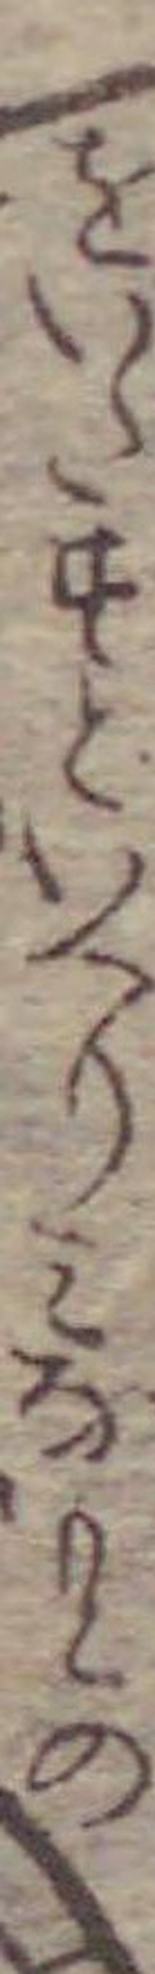をいだすといへりみなもとの
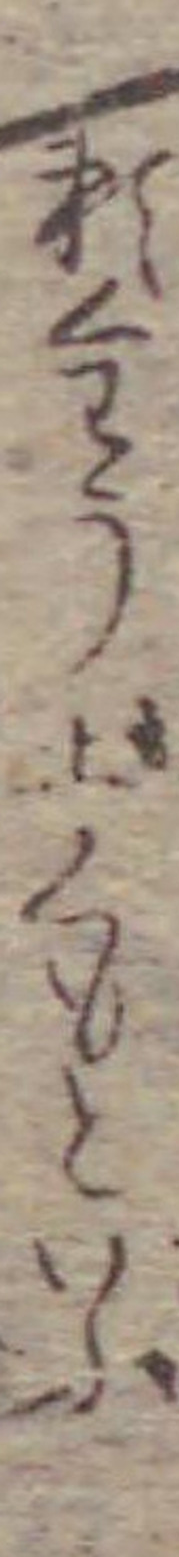頼くわう土くもといふ
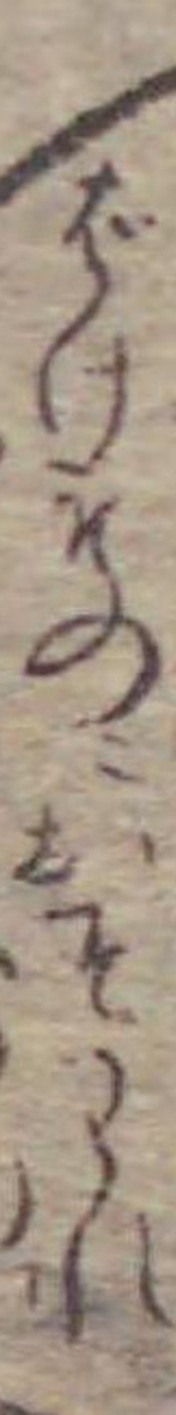ばけものにおそわれ
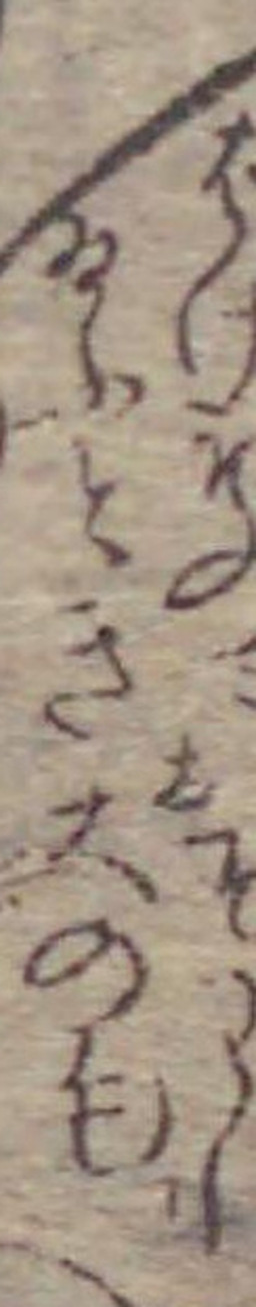給ふとき大の毛
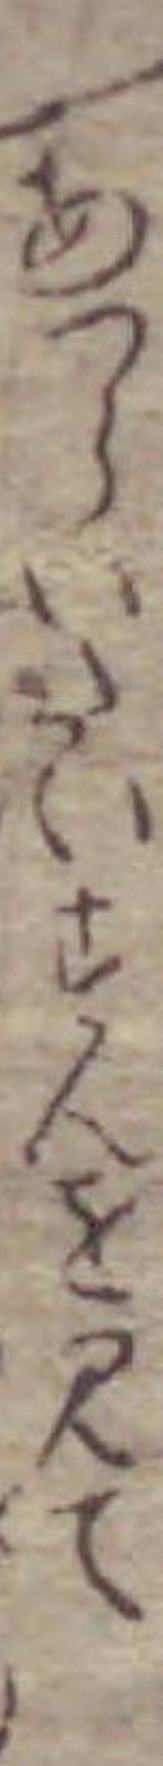あつらいたいすんを尺て
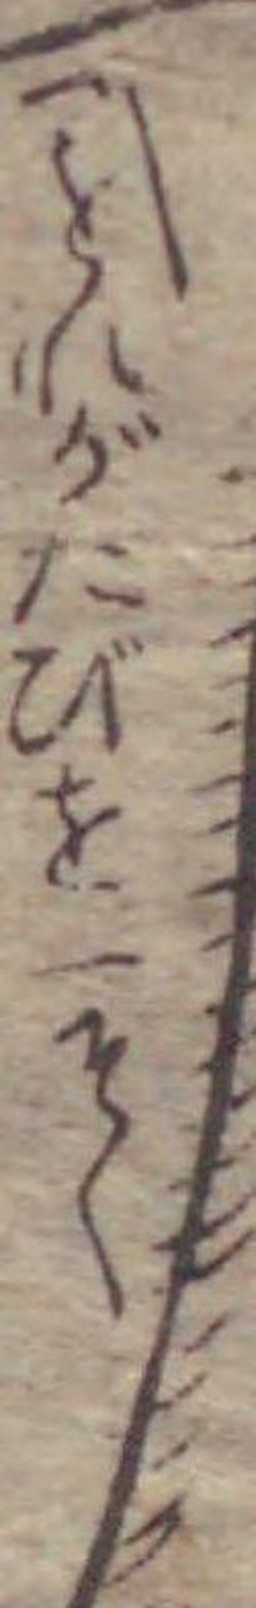〽おれあたびを一そく
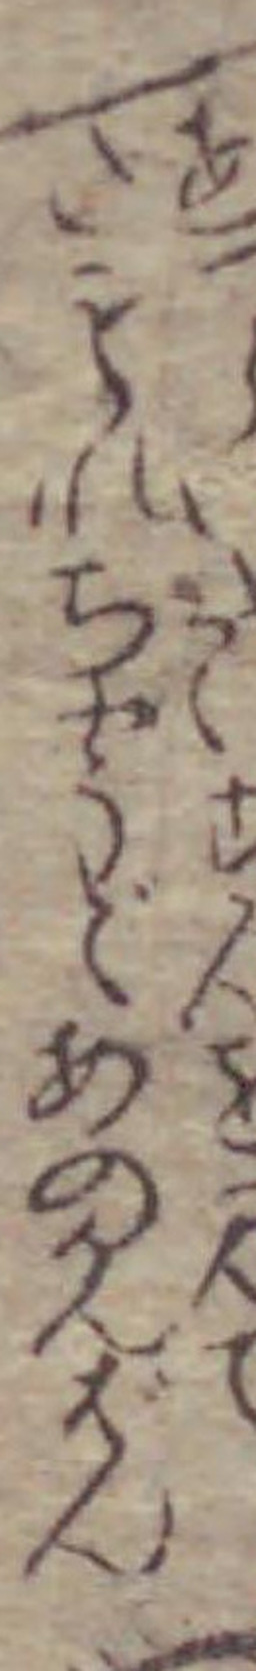たもれちやうどあのかんばん
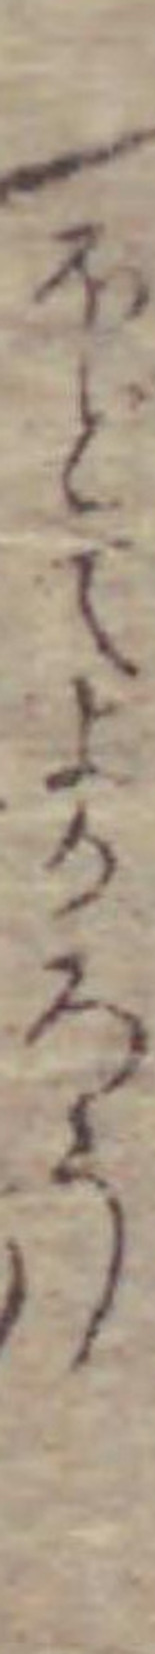ほどてよかろう
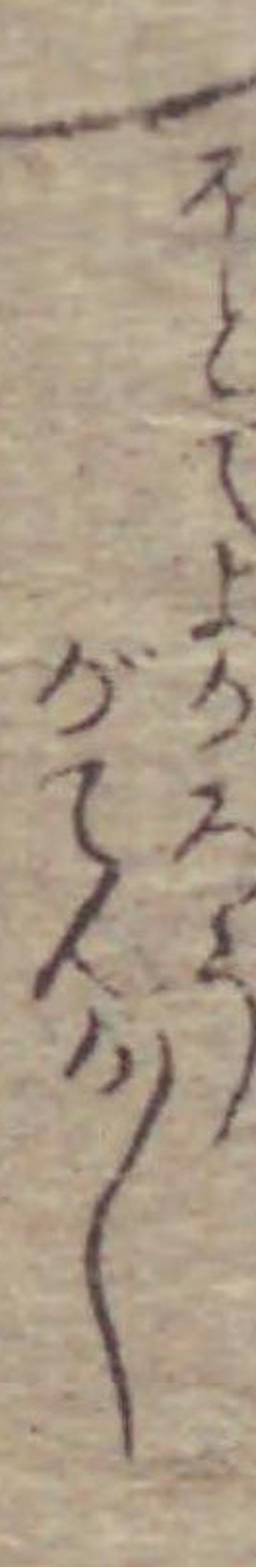がてんか〳〵
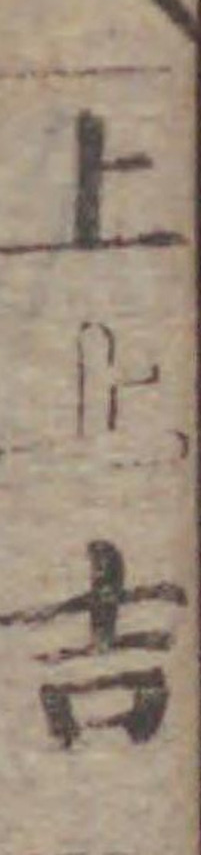上上吉
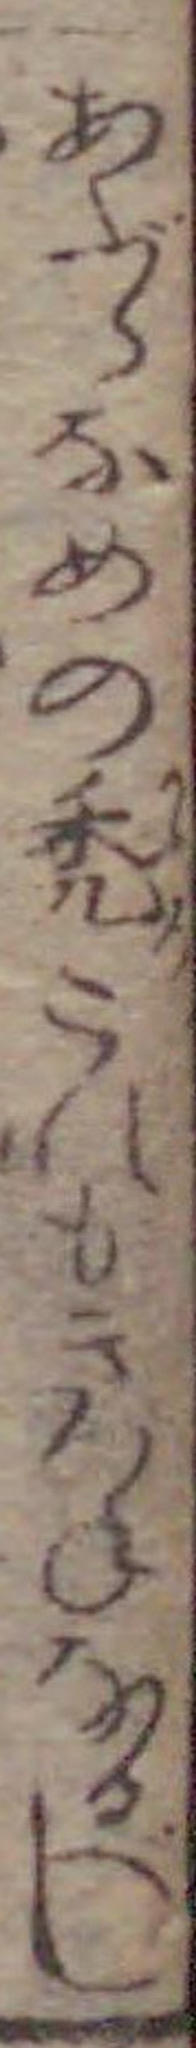あぶらなめの禿これもきつねなるべし
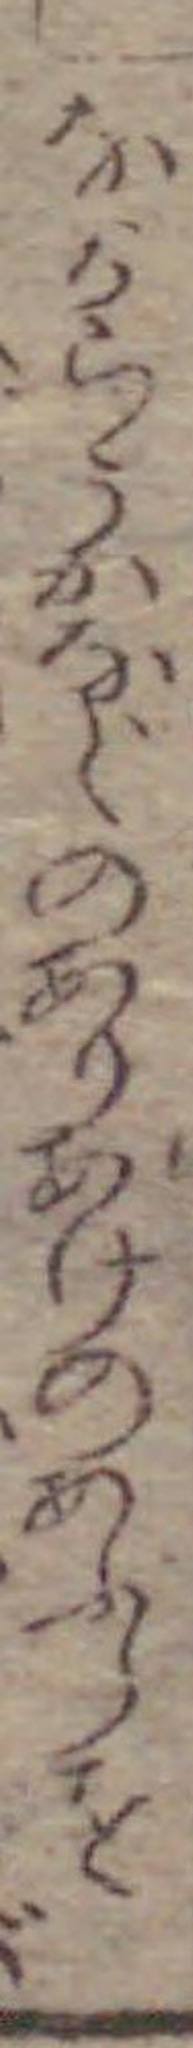なからうかなどのありあけのあふらを
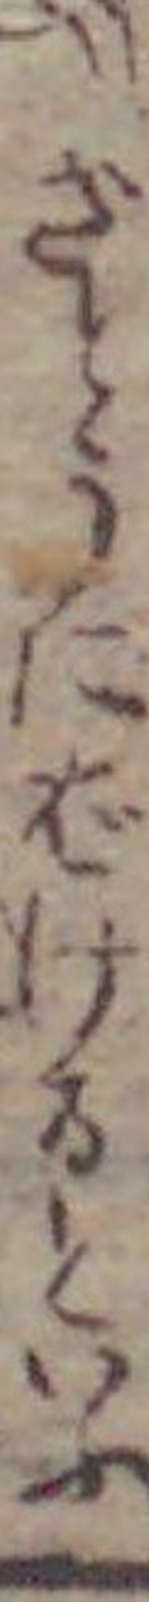ざとうにばけるといふ
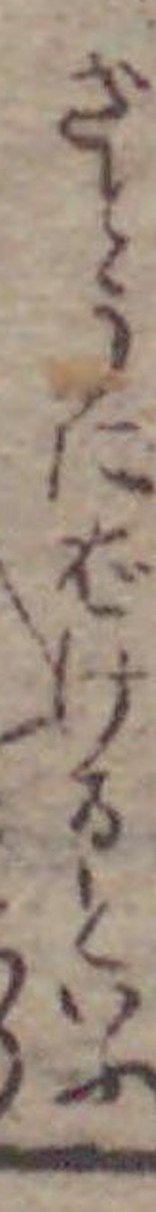ざとうにばけるといふ
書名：妖怪仕内評判記 : 2巻
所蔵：国立国会図書館 National Diet Library, JAPAN
